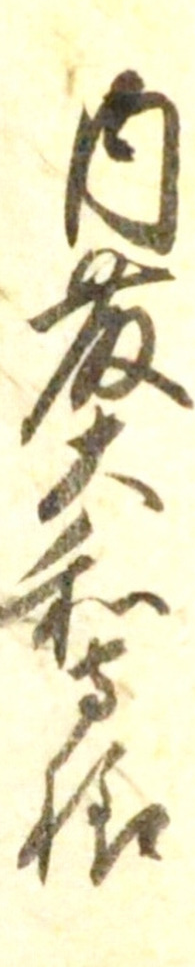内藤大和守様

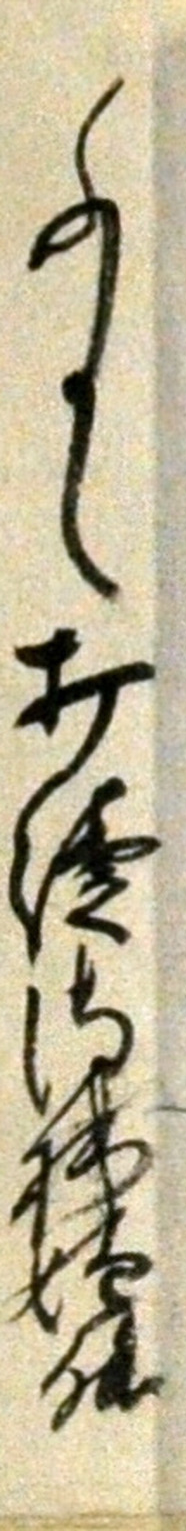尚々打続御機嫌能
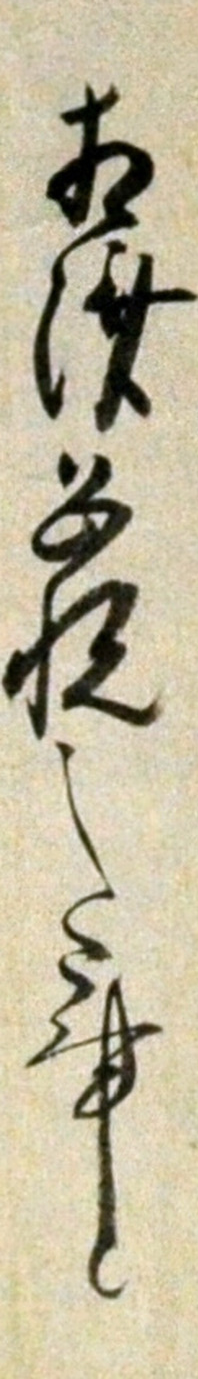相済恐悦之御事候
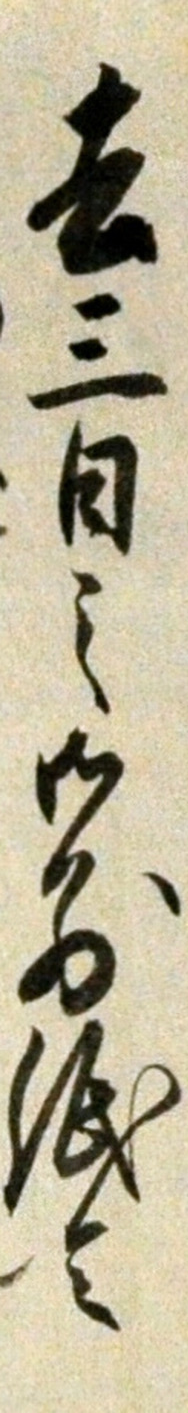去三日之御別紙令
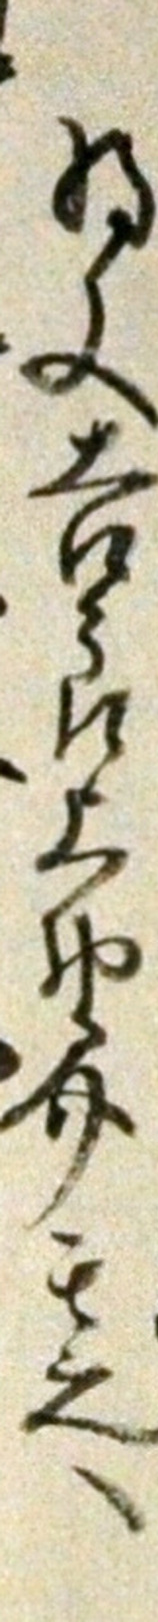将又吉良上野介其元へ
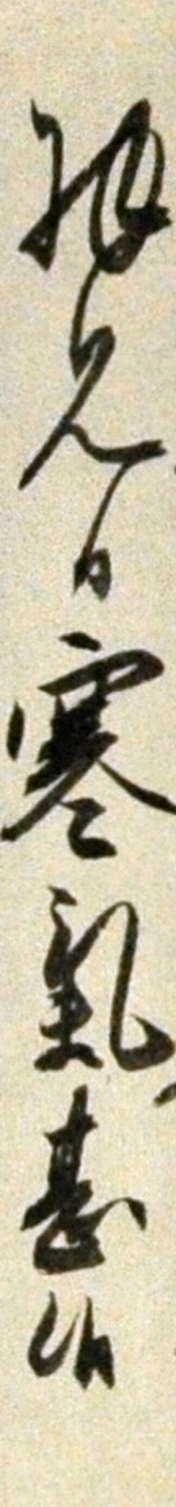拝見候寒気甚候
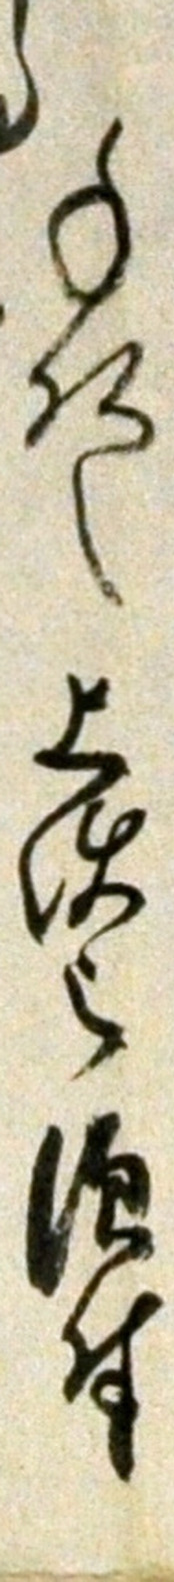年頭之上使被仰付
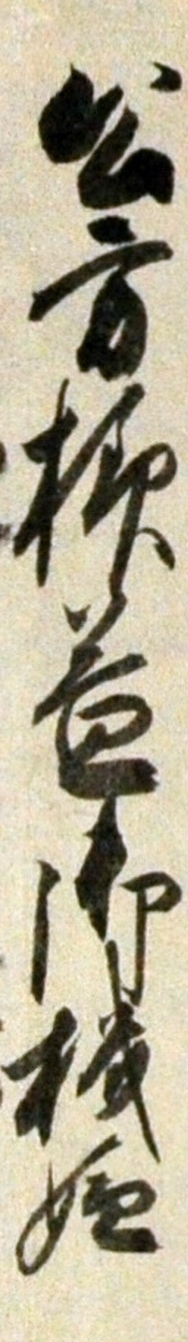公方様益御機嫌
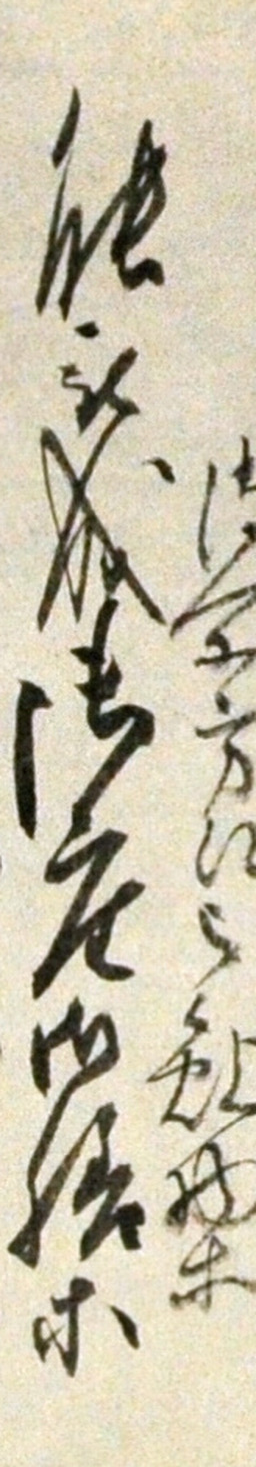能被成御座御膳等
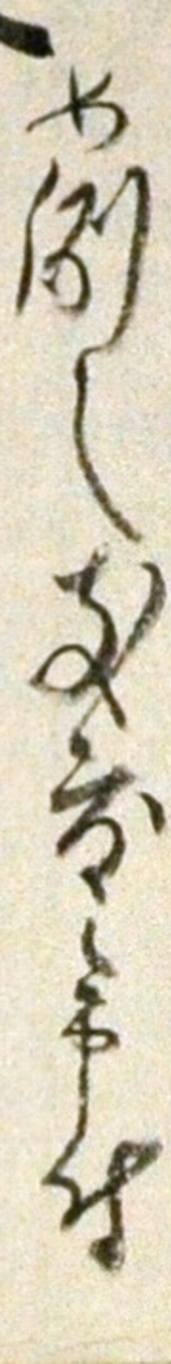如例之支度被申付
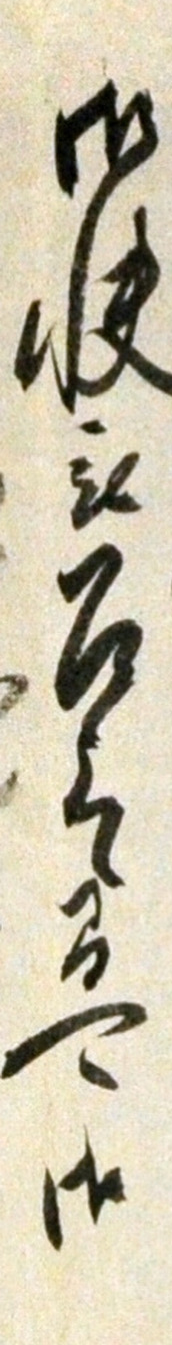御快被召上候間可御
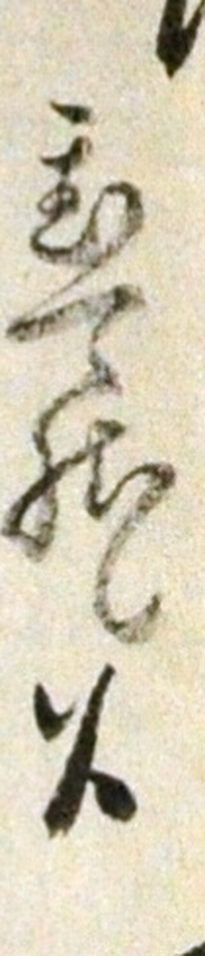置可然候以上
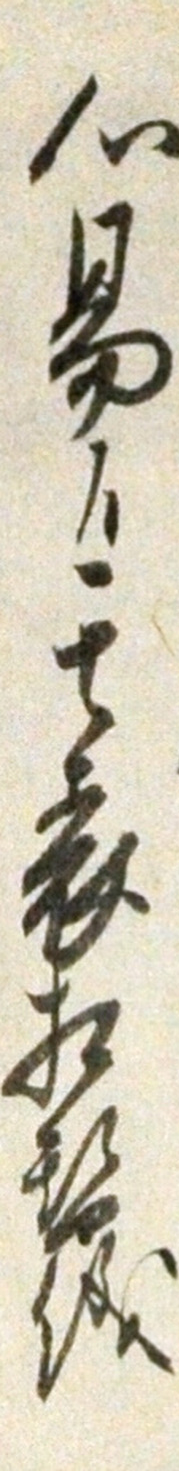心易候其表相替儀
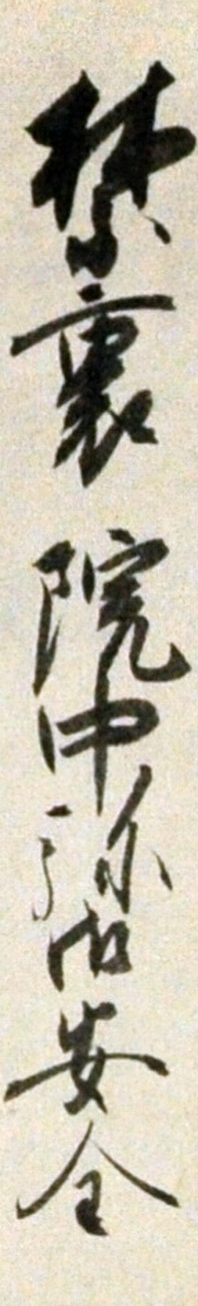禁裏院中弥御安全
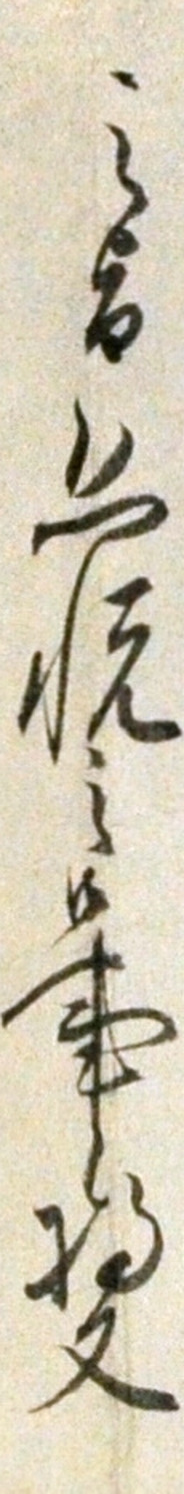之旨恐悦之御事候将又
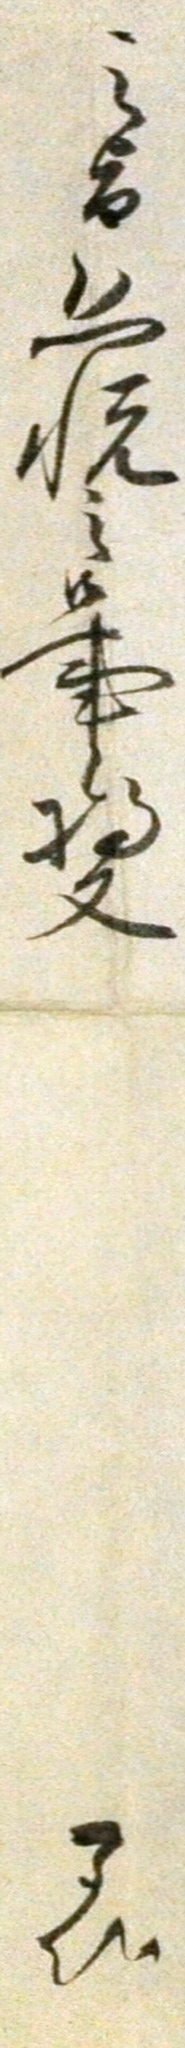之旨恐悦之御事候将又
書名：書状
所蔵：伊那市立高遠町図書館・合同会社AMANE
